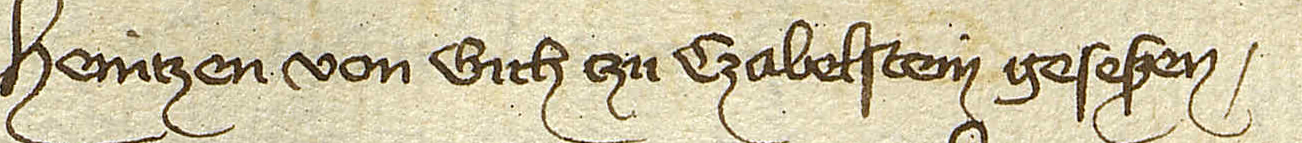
heincʒen von Gich cʒu Cʒabelſtein geſeſʒen /
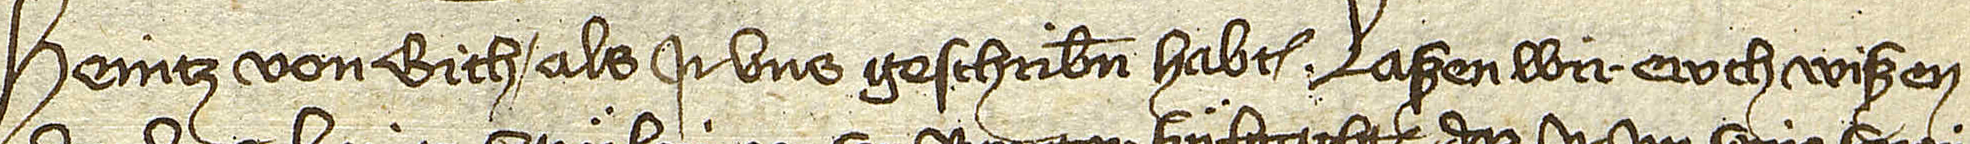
Heincʒ von Gich / als Ir vns geſchribn* habt . Laſʒen wir ewch wiſʒen
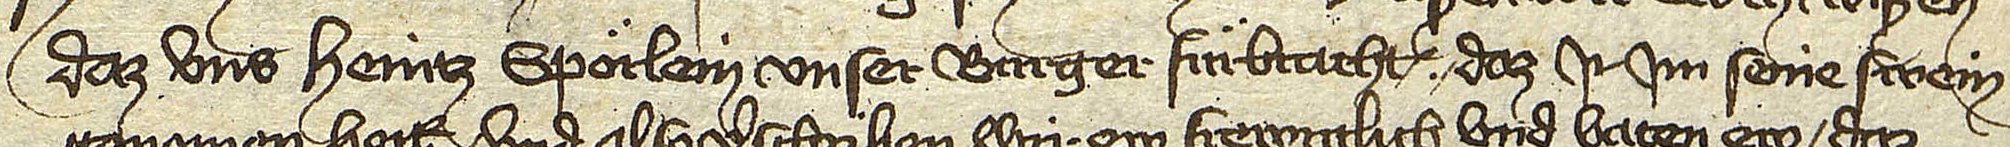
daʒ vns heincʒ Spörlein vnſer Burger fürbracht . / daʒ Ir Im ſeine ſwein
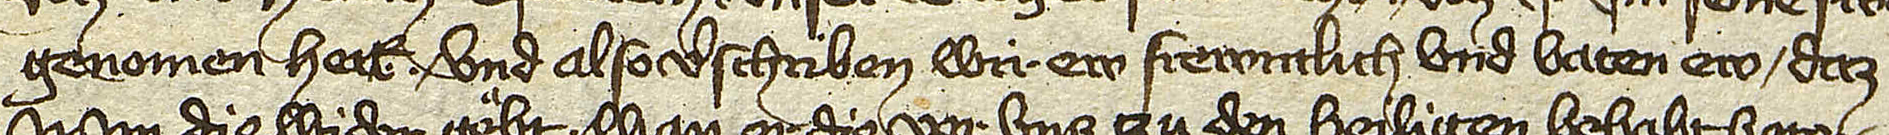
genomen hett . / vnd alſo v*ſchriben wir ew frewntlich vnd baten ew / daʒ
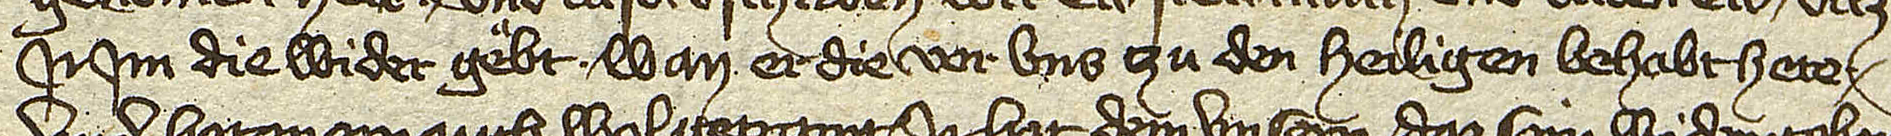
Ir Im die wider gëbt . / wan er die vor vns cʒu den heiligen behabt hete . /
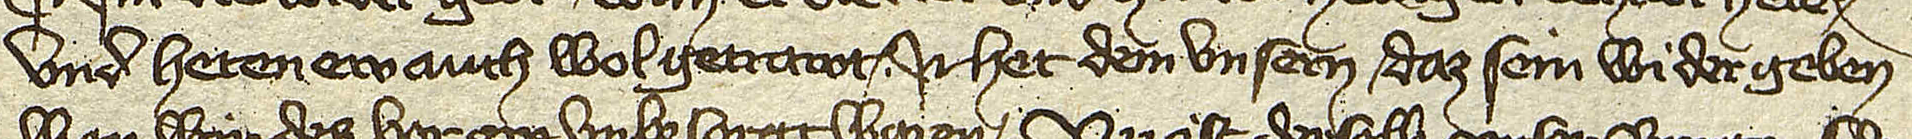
vnd heten ew auch wol getrawt . Ir het dem vnſern / daʒ ſein wider geben
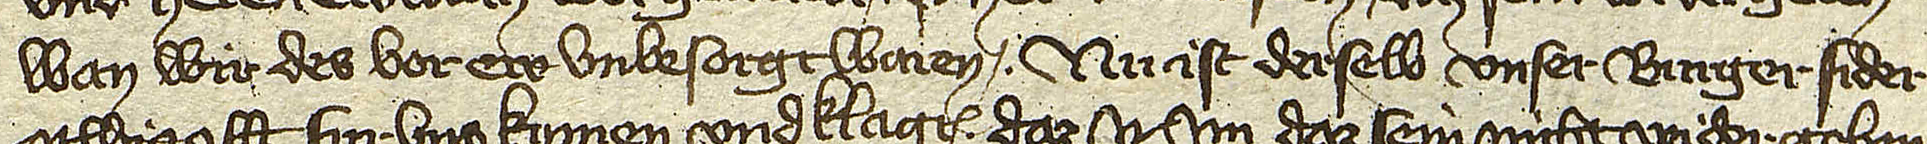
wan wir des vor ew vnbeſorgt waren / . Nu iſt derſelb vnſer Burger ſider
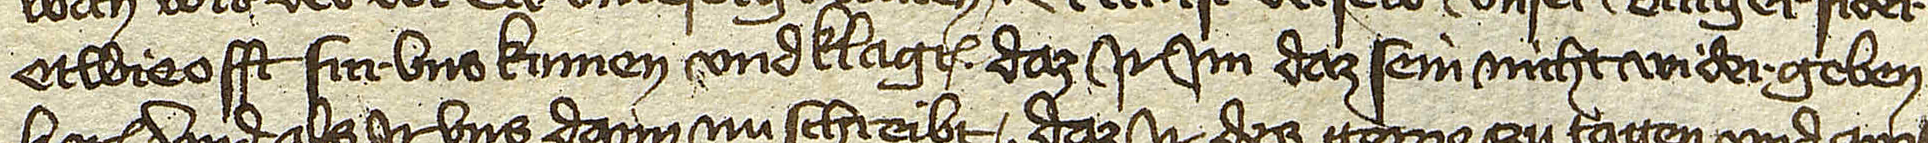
etwieofft fur vns kumen vnd klagt . daʒ Ir Im daʒ ſein nicht widergeben
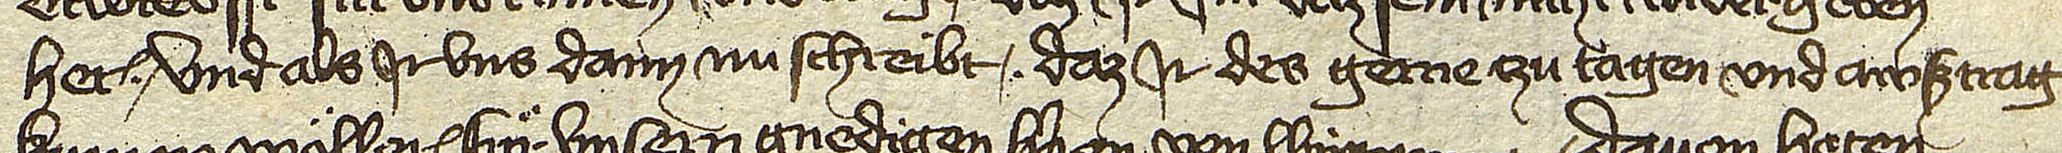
het . / vnd als Ir vns dann nu ſchreibt / . daʒ Ir des gerne cʒu tagen vnd awſʒtrag
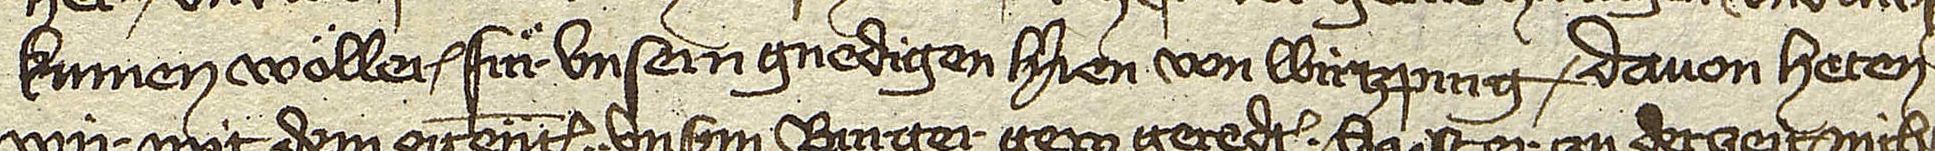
kumen wöllet für vnſern gnedigen h*ren von wircʒpurg / dauon heten
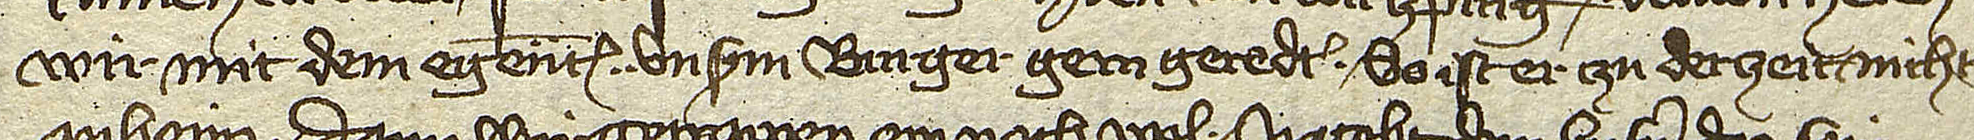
wir mit dem egen*t* ~ vnſ*m Burger gern geredt . / So iſt er cʒu dercʒeit nicht
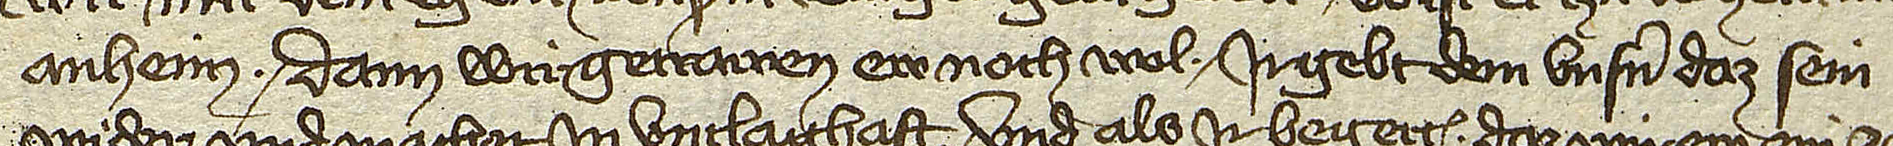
anheim . / Dann wir getrawen ew noch wol . / Ir gebt dem vnſn* daʒ ſein
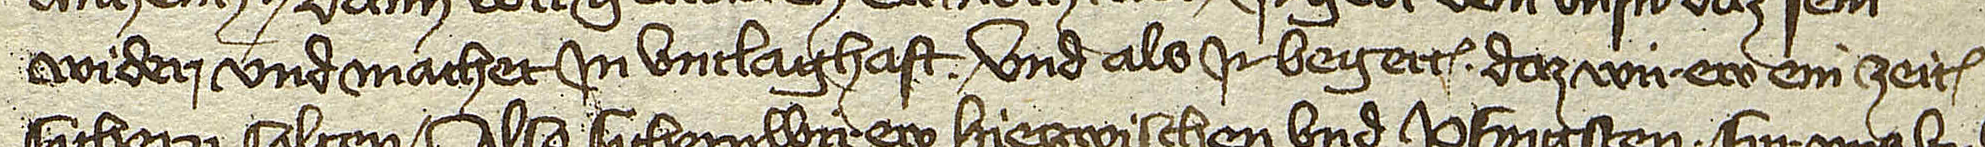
wider vnd machet In vnclaghaft . / vnd als Ir begert . daʒ wir ew ein cʒeit*
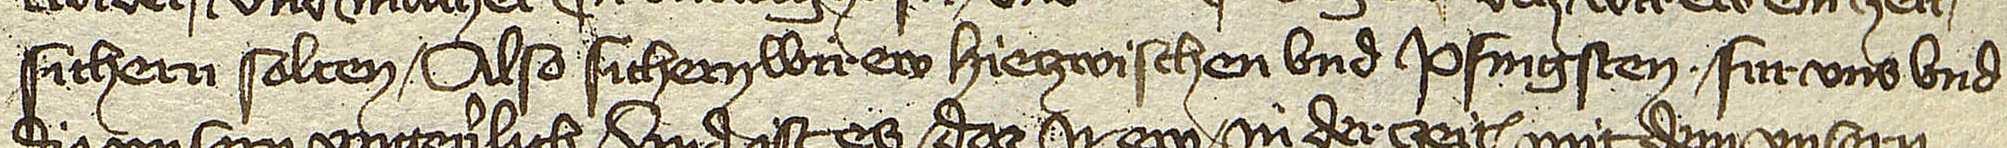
ſichern ſolten / Alſo ſichern wir ew hiecʒwiſchen vnd Pfingſten . fur vns vnd
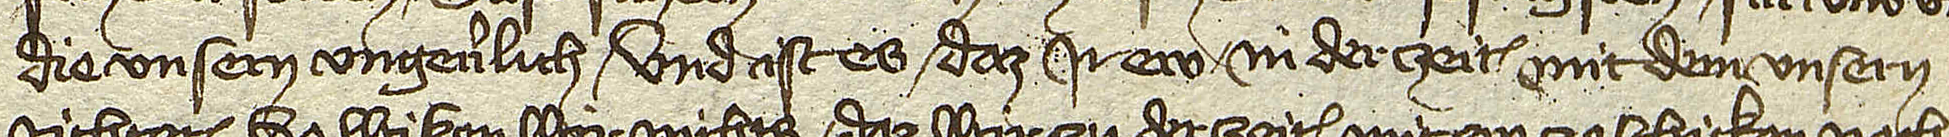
die vnſern vngeu*lich / vnd iſt es / daʒ Ir ew / in der cʒeit mit dem vnſern
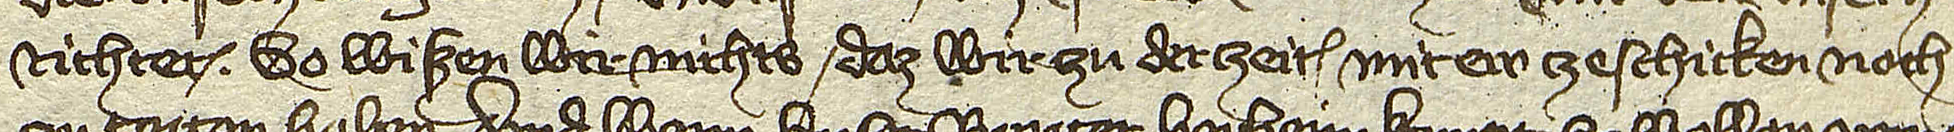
richtet . So wiſʒen wir nichts / daʒ wir cʒu der cʒeit mit ew cʒeſchicken noch
